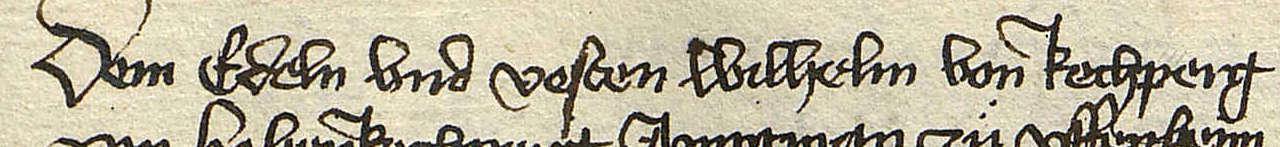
Dem Edeln vnd veſten Wilhelm von Rechperg
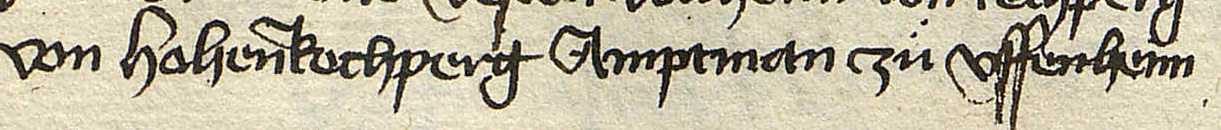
von hohenRechperg Amtpman ʒü vffenheim
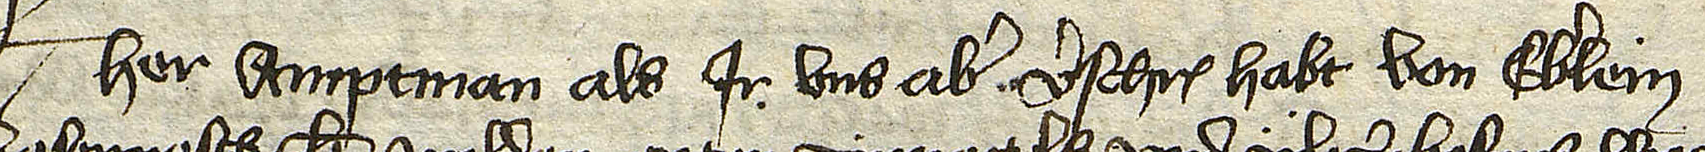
L * her Amptman als Ir vns ab* v*ſchr* habt von Eb*lein
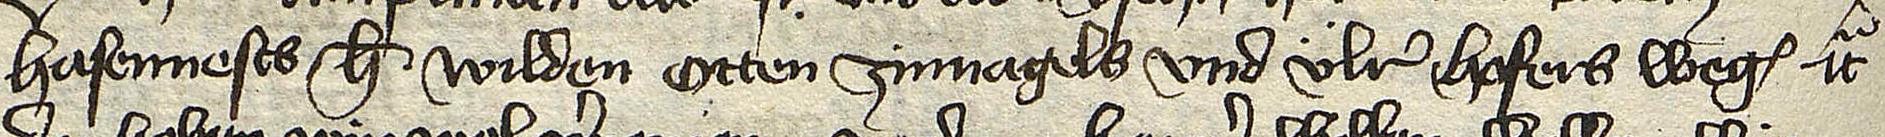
haſenneſts h* wilden Otten ʒinnagels vnd v̈lr* hofers weg* ec*
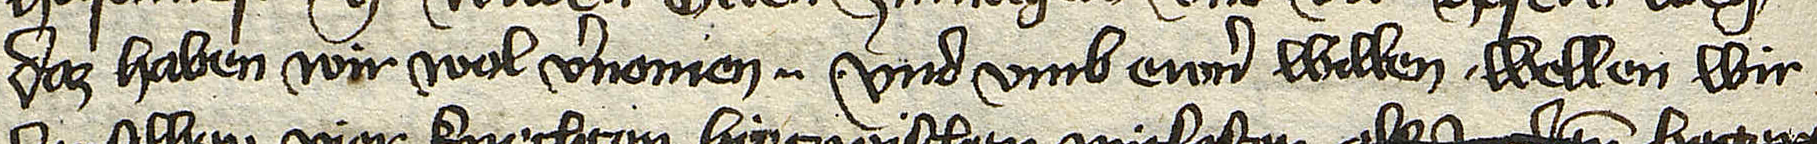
daʒ habe wir wol v*nomen . vnd vmb ew*n willen . wellen wir
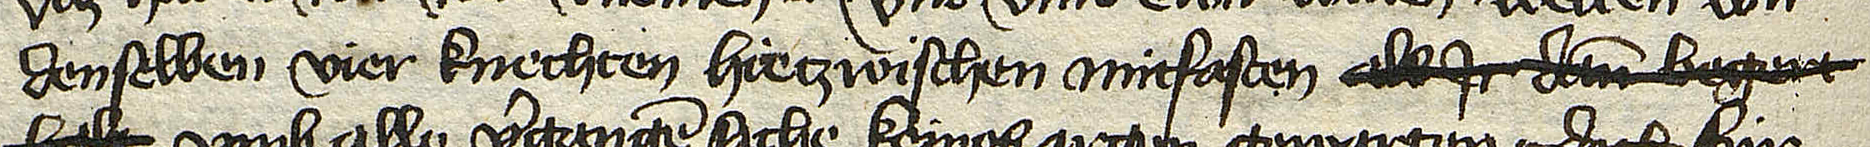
denſelben vier knechten hiecʒwiſchen mitfaſten als Ir dan* begert
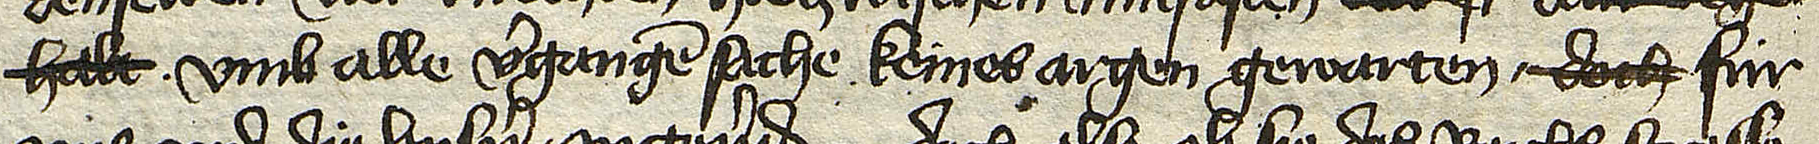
habt . vmb alle v*gange* ſache keines argen gewarten / doch für
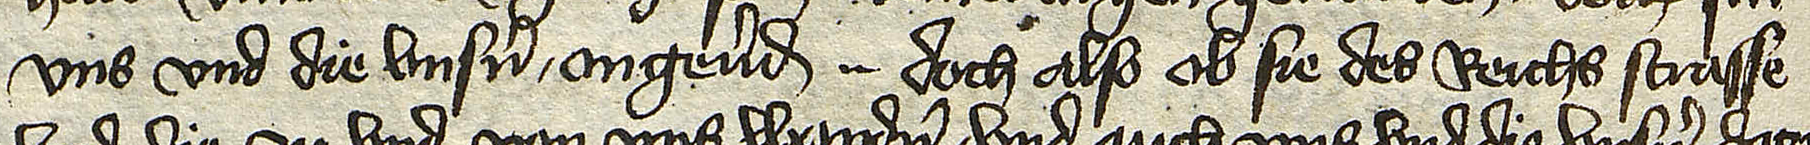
vns vnd die vnſ*n / ongeu*d* ~ doch alſ* ob ſie des Reichs ſtraſſe
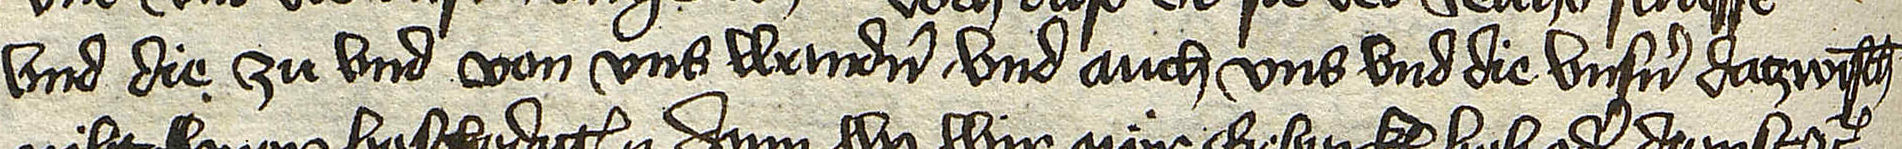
vnd die ʒu vnd von vns wandn* / vnd auch vns vnd die vnſ*n dacʒwiſch*
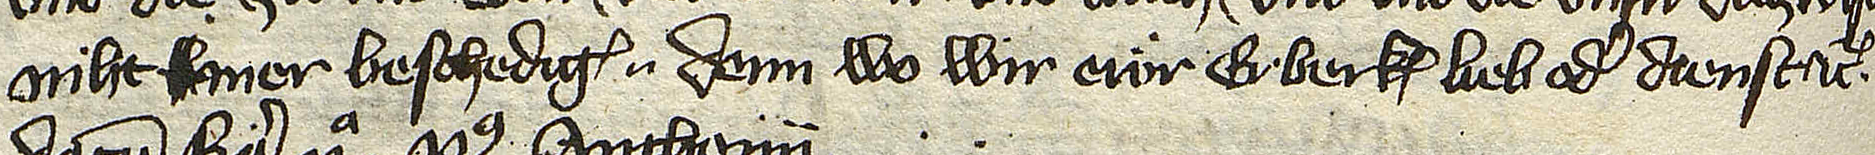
niht lmer beſchedig* ~ Denn wo wir eẅr erberk* lieb od* dienſt ec*
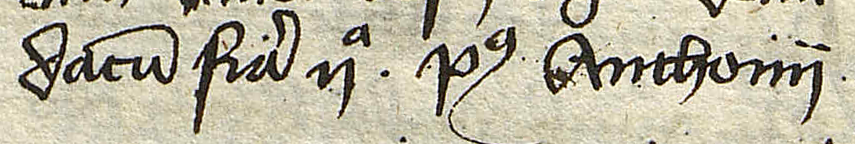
Dat* f*ia ii* . p* Anthonii
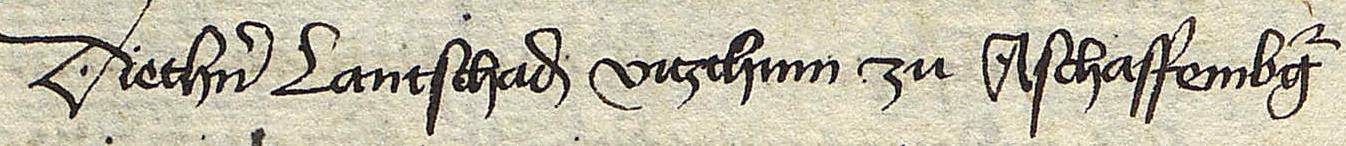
Dieth*n Lantſchad* vicʒthum ʒu Aſchaffemb*g
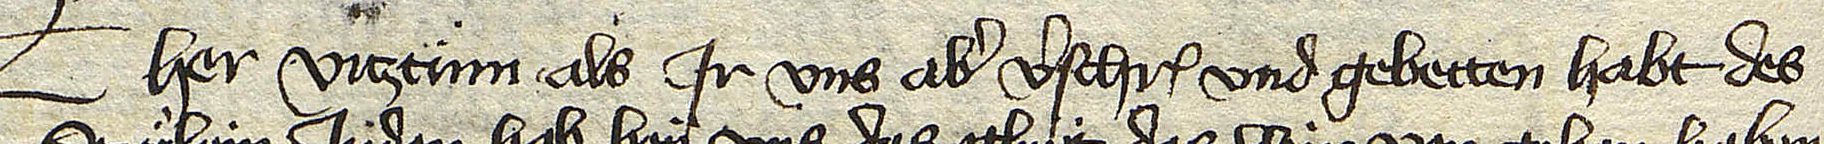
L* her vicʒtum als Ir vns ab* v*ſchr* vnd gebetten habt des
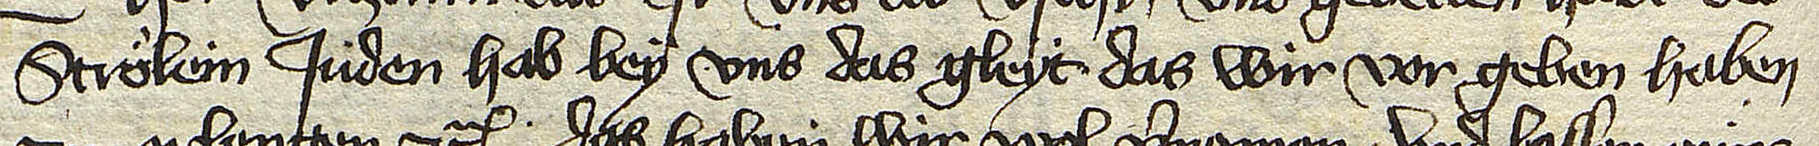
Strölein Iuden hab bey vns das gleyt das wir vor geben haben
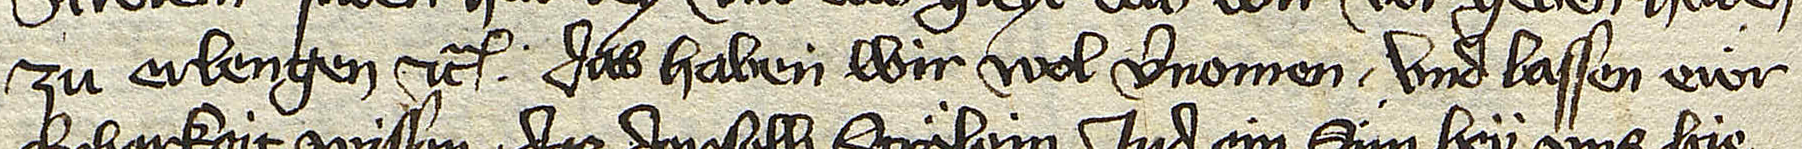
ʒu erlengen ec* das haben wir wol v*nomen / Vnd laſſen eẅr
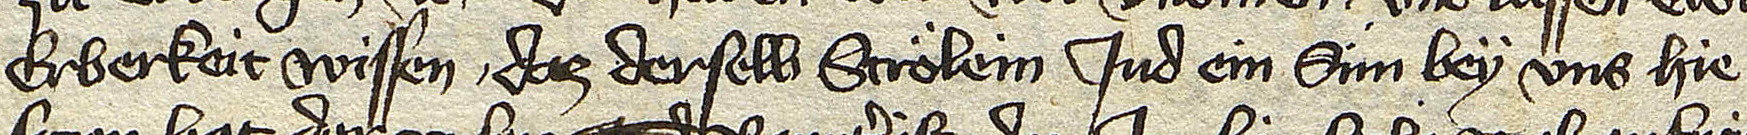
Erberkeit wiſſen / daʒ derſelb Strölein Iud ein ... bey vns hie
